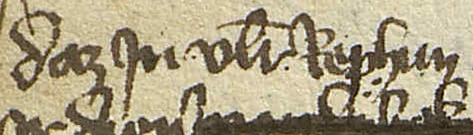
daʒ In vlr* Rephun
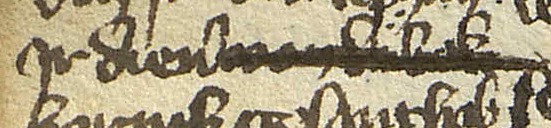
Ir dien* von lübek
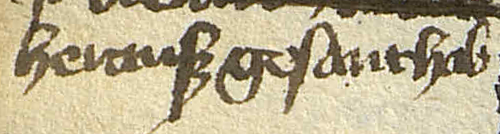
herauſʒ geſant hab
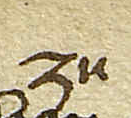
ʒu
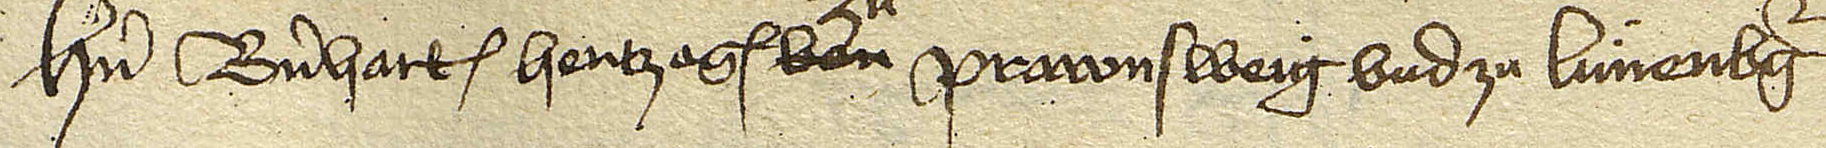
hn* Bn*hart* hertʒog* von Prawnſweig vnd ʒu lünenb*g
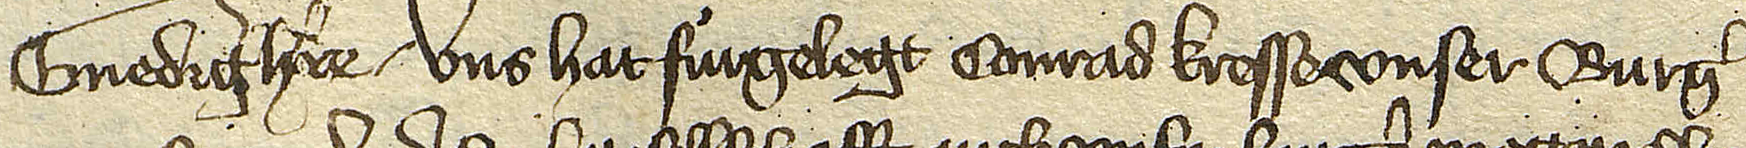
Gnedig* h*re / Vns hat fürgelegt Conrad kreſſe vnſer Burg*
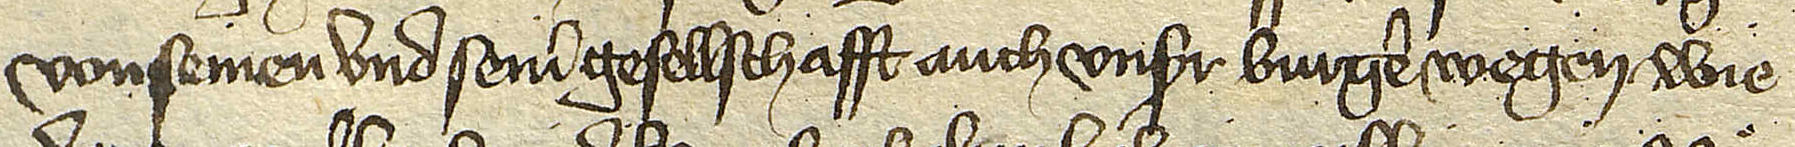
von ſeinen vnd ſein* geſellſchafft auch vnſ*r burge* wegen / wie
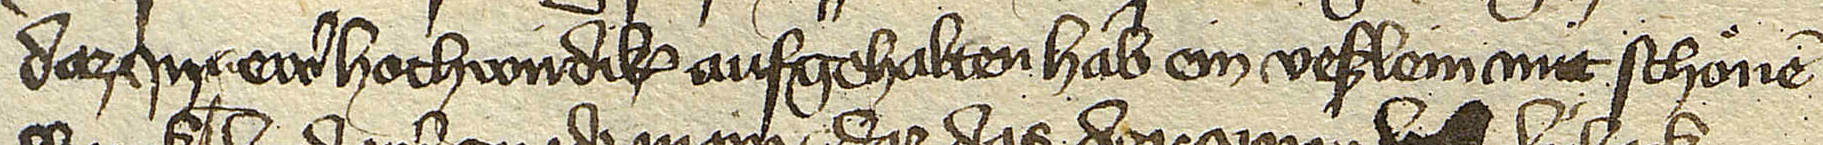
daʒ Im ewr* hochwirdik* aufgehalten hab ein veſʒlein mit ſchöne*
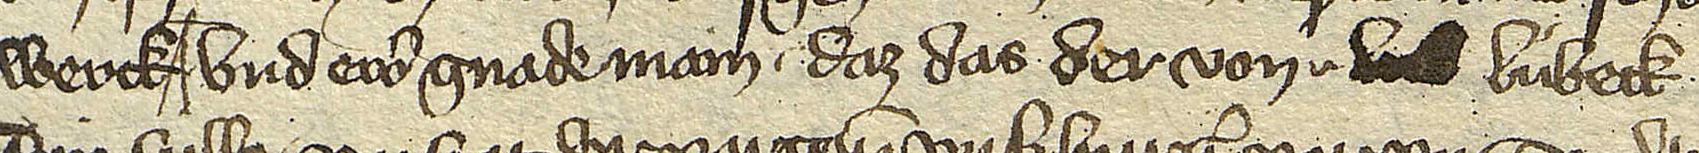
werck vnd ew* gnade main / daʒ das der von ~ lub lübeck
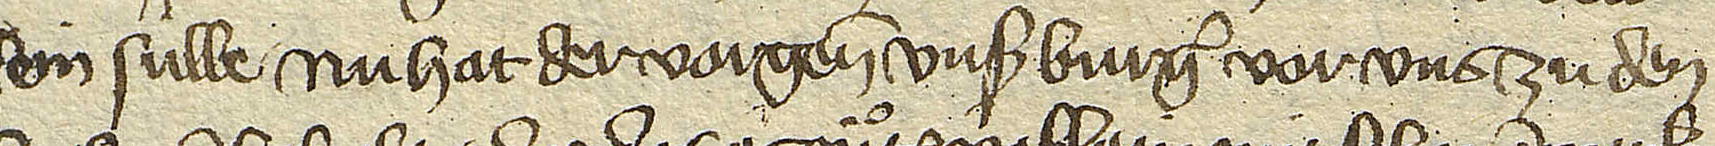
ſein ſülle / Nu hat der vorgen* vnſ* burg* vor vns cʒu den
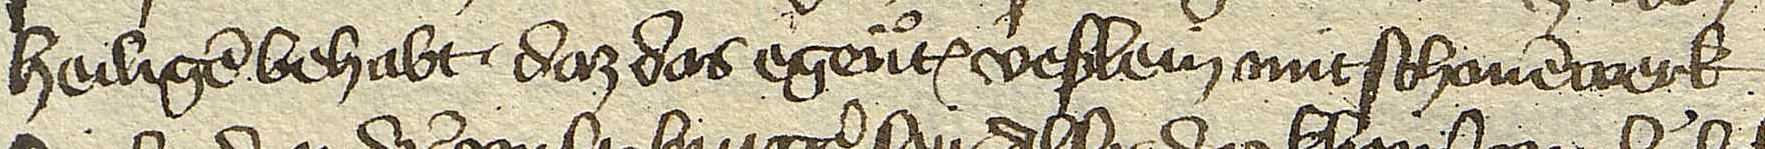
heilige* behabt / daʒ das egent* veſʒlein mit ſchone* werk
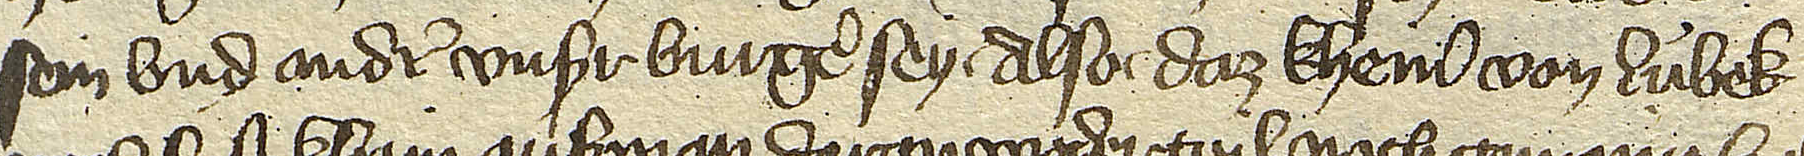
ſein vnd andr* vnſ*r burge* ſey / Alſo / daʒ khein* von Lübek
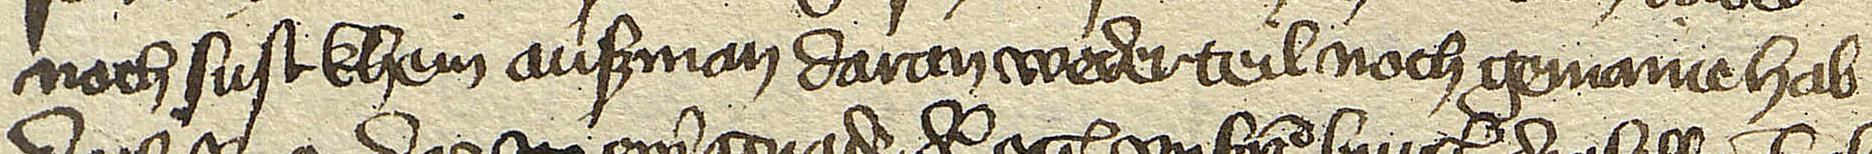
noch ſuſt khein auſʒman daran weder teil noch gemaine hab
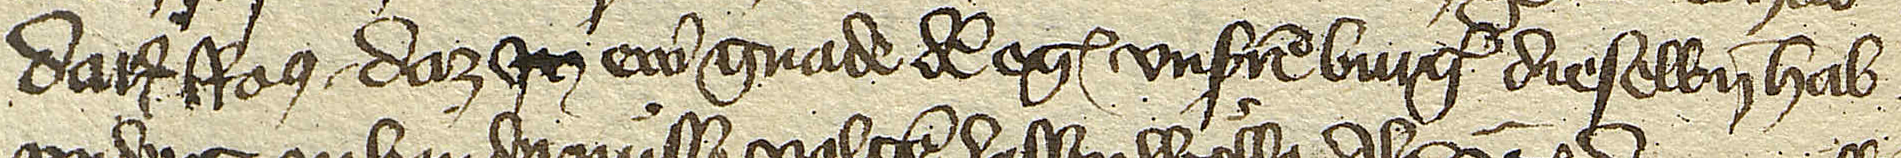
dar* Ro* / daʒ Ir ew* gnade d* eg* vnſ*re burg* dieſelbn* hab
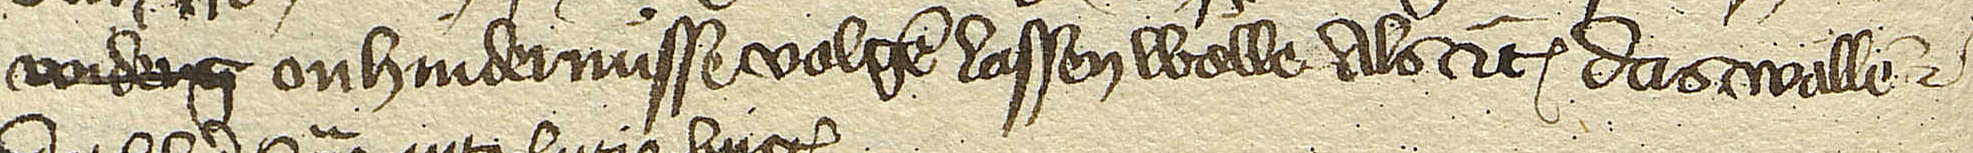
vo%derg on hindernüſſe volge* laſſen wölle / Als ec* das wölle*
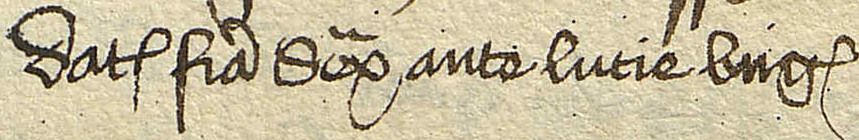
Dat* fia* Sex* ante lucie virg*
